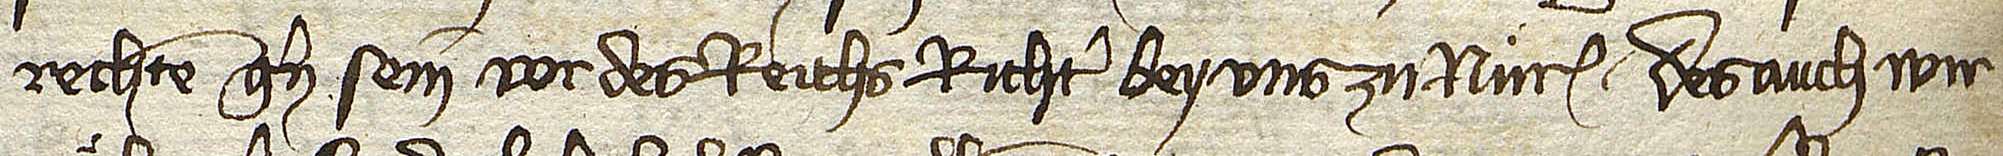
rechte* g*n ſein vor des Reichs Richt* bey vns ʒu Nür* / Des auch wir
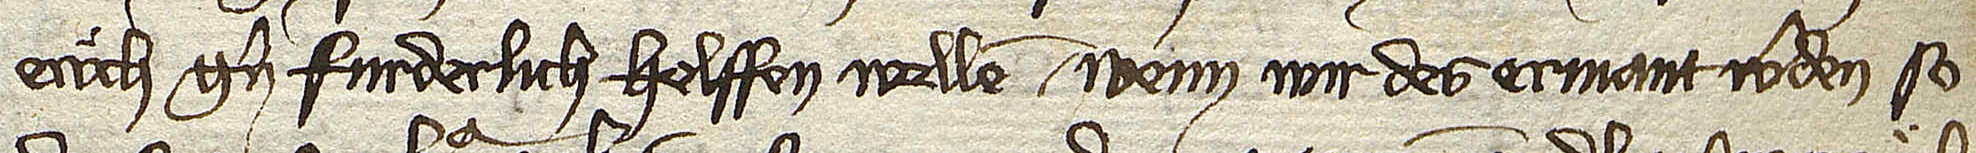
ewch g*n furderlich helffen welle* / wenn wir des ermant w*den ſo
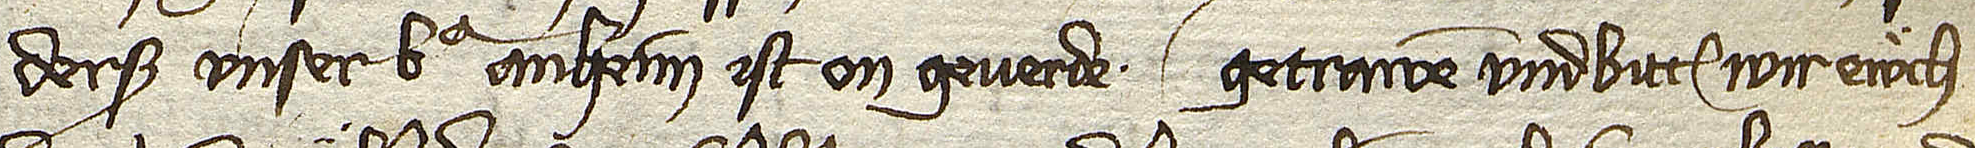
derſ* vnſer b* anheim iſt on geuerde . getrawe* vnd bitt* wir ewch
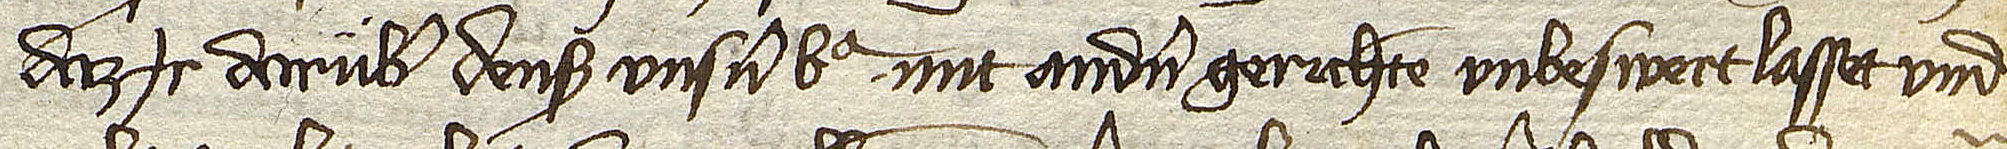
daʒ Ir darüb* denſ* vnſn* b* mit andn* gerichte* vnbeſwert laſſet vnd
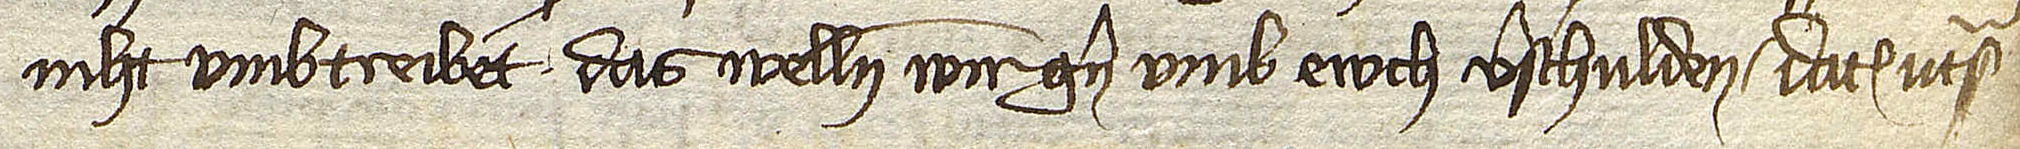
niht vmbtreibet . das welln* wir g*n vmb ewch v*ſchulden / Dat* ut ſ*
